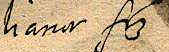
lianor frz̄
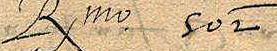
℞mo sor̄
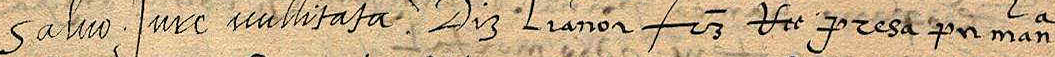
Saluo Jure millitata Diz Lianor frz̄ Ree presa per manra
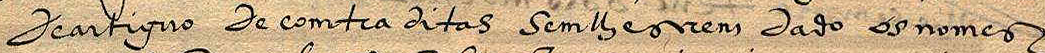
De artiguo de comtraditas Sem lhe serem dado os nomes
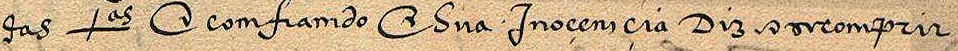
das tas e comfiamdo ē Sua Jnoçemçia Diz e se comprir
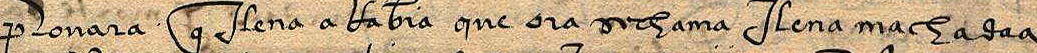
prouara q̄ Jlena aRabia que ora se chama Jlena machadaa
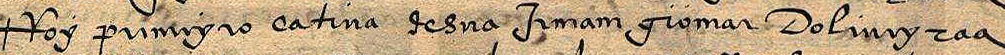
ffoy primeyro catiua de sua Jrmam giomar Doliueyraa
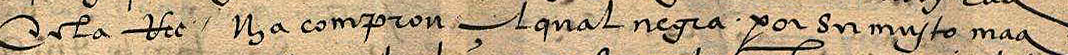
e ela Ree / lha comprou A quaL negra. por ser mujto maa
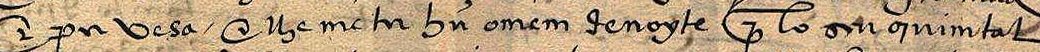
e pervesa / e lhe meter hū omom de noyte p̄lo seu quimtaL
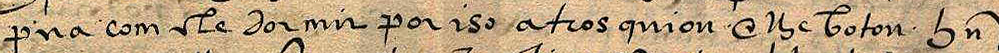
per com ele dormir por iso a trosquiou e lhe botou hū
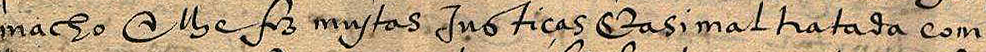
macho e lhe fez mujtas Justiças E asi mal tratada com
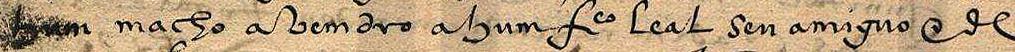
hum macho a vemdeo a hum fco leaL seu amiguo e de
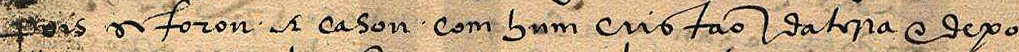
pois se forou e casou com hum cristaõ da terra e depo
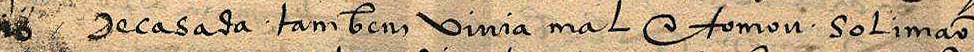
is / de casada tambem viuia maL e tomou SoLimaõ
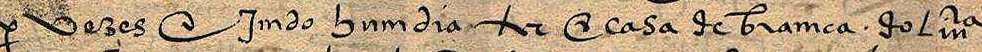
ꝑ vezes e Jmdo hum dia ter ē casa de bramca. doliura
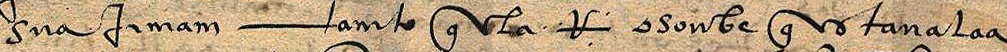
sua Jrmam tamto q̄ ela R o soube q̄ estaua laa
